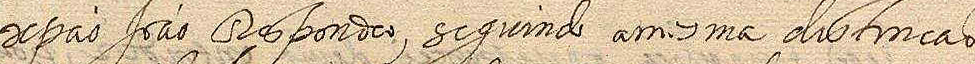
xpaõ João Respondeo, seguindo a mesma distincaõ
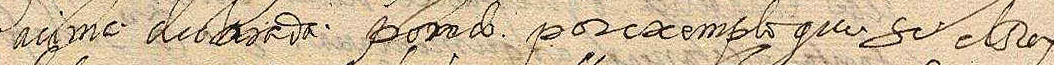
acima declarada. pondo. por exemplo que se el Rey
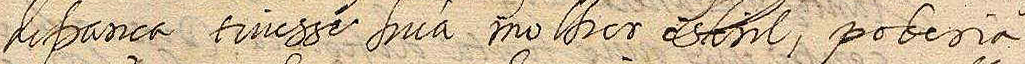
de frança tiuesse huā molher esteril, poderia
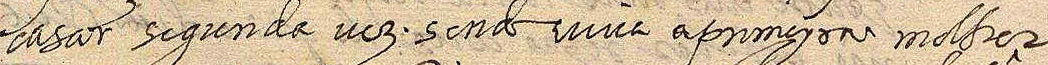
casar segunda uez. sendo uiua a primeyra molher
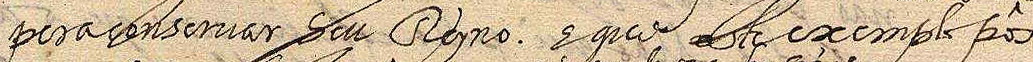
pera conseruar Seu Reyno. E que este exemplo pôs
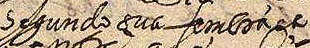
segundo dia lembrāça
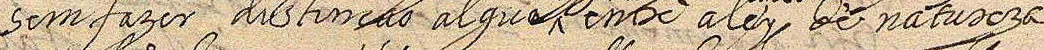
sem fazer distinção alguā entre a ley de natureza
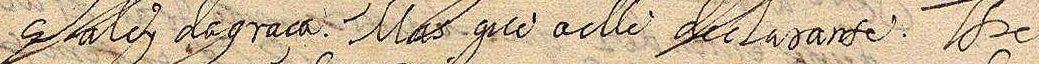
E a ley da graça. Mas que a elle declarante. lhe
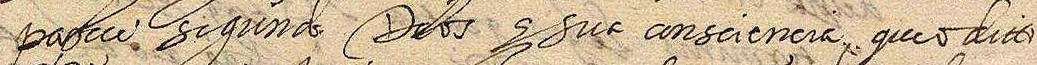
pareçe segundo Deos E sua consciençia, que o ditto
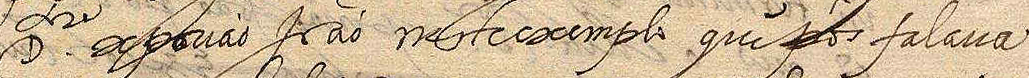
D.tor xpouão Joaõ neste exemplo que pos falaua
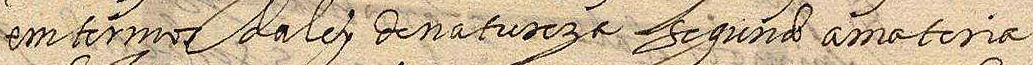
em termos da ley de natureza segundo a materia
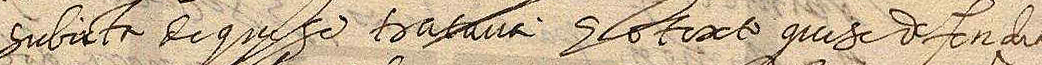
subicta de que se trataua. E cōtexto que se defendia
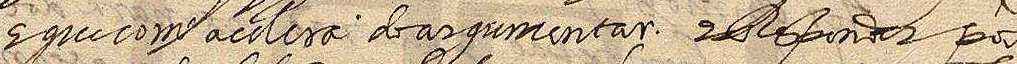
E que com a colera do argumentar E Responder pôs
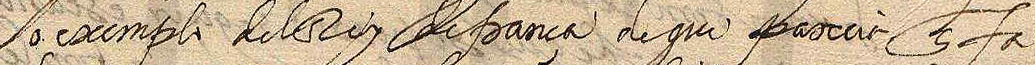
o exemplo del Rey de frança de que parecia q̄ fa
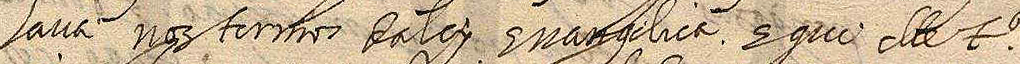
laua nos termos da ley Euangelica. E que elle t.a
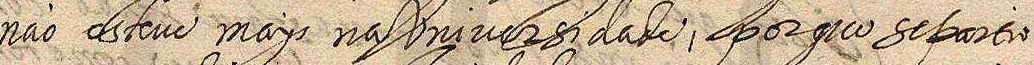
naõ esteue mays na Vniuersidade, por que se partio
